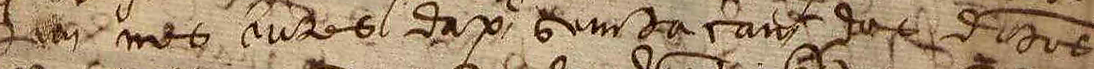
tem nos autos dap̄semtaçam das ditas
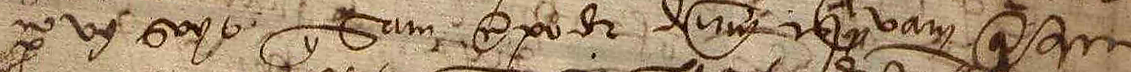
provysoys q̄ sam ē poder de m̄y esp̄vam ātre
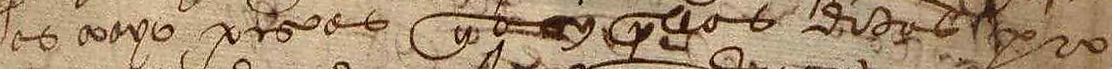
as coays pesoas q̄ asy p̄llas ditas pro
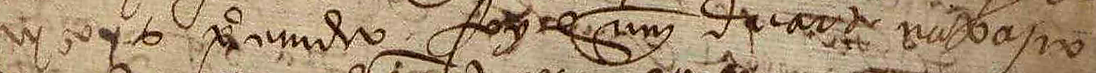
vysoys p̄emdeo foy hum duarte navaro
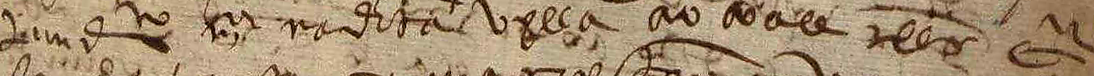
temdro mor na dita vylla ao coall elle Cor
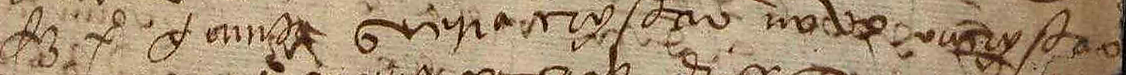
fez p̄gumta se era crystão novo ou crystao
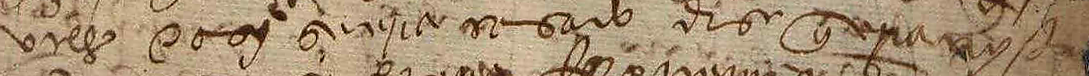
velho e asy se era casado dise q̄ era crysta
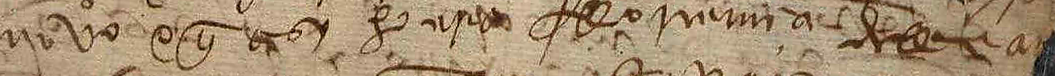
novo e q̄ asy ho era flloremça de lleia
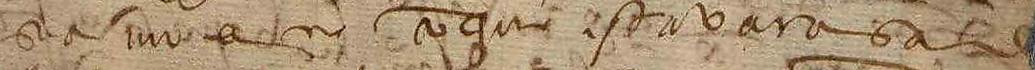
sua molher c̄o que estava casad
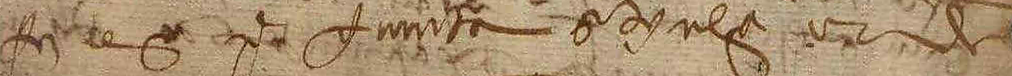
fez lhe p̄gumta se tynha ordē
